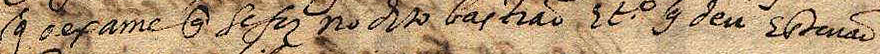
q̄ o exame q̄ se fez no dito bastiaõ E t.o q̄ deu Esteuaõ
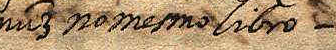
nūz no mesmo libro
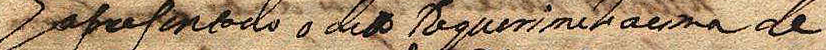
E apresentado o ditto Requerimēto acima de
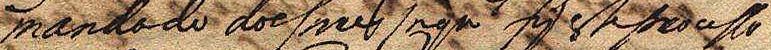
mandado dos snres̄ Jnqures fis este processo
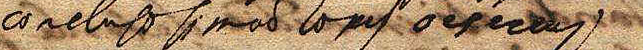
concluso simaõ lopes o escreuj
